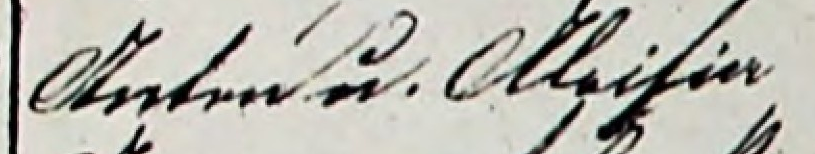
Anton u. Aloisia
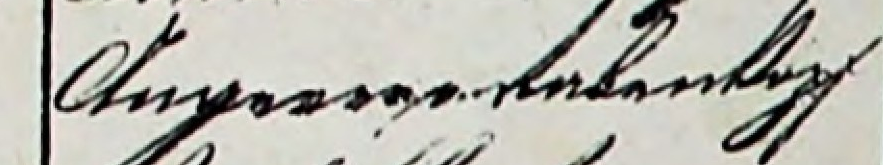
Angerer v. Rabenkopf
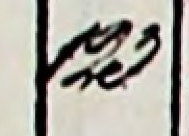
123
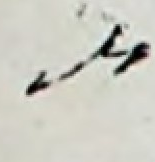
do
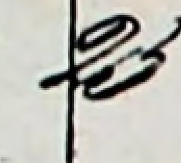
25
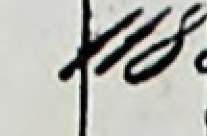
118
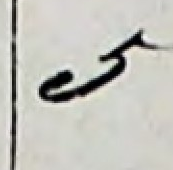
5
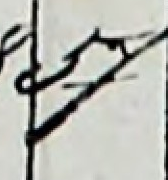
57
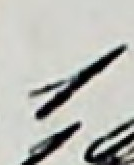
1
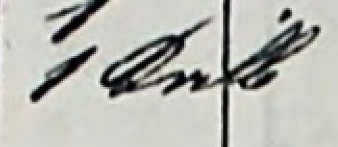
1 Kalb
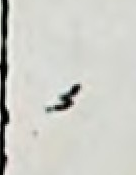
„
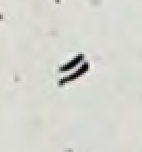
„
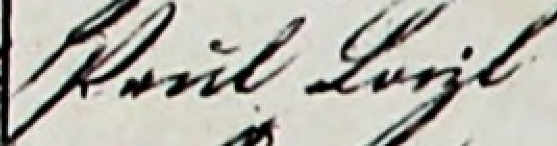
Paul Loizl
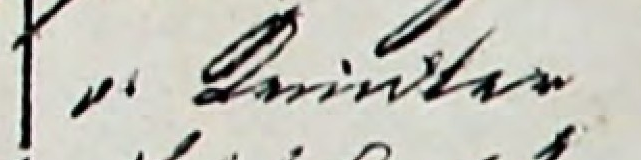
v. Krindler
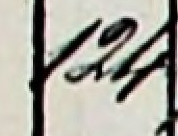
124
